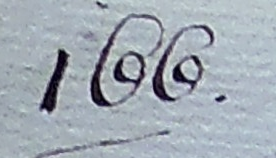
166.
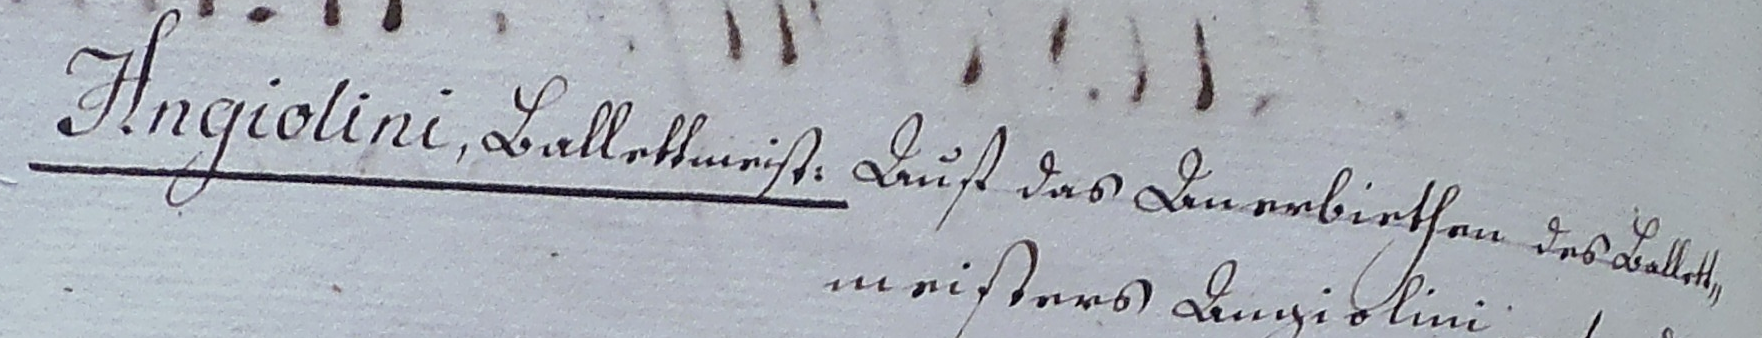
Angiolini, Ballettmeist: Auf das Anerbiethen des Ballett¬
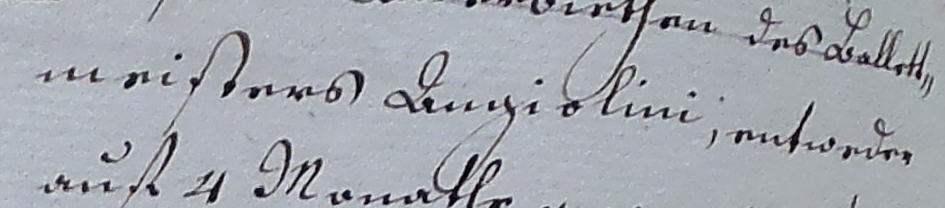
meisters Angiolini, entweder
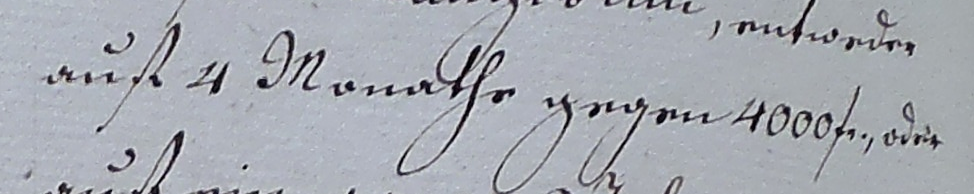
auf 4 Monathe gegen 4000fr., oder
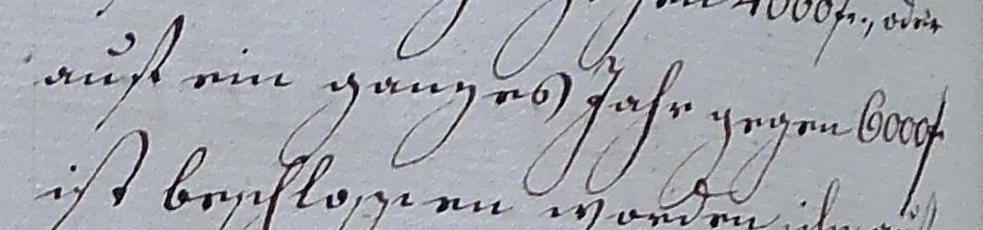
auf ein ganzes Jahr gegen 6000fr
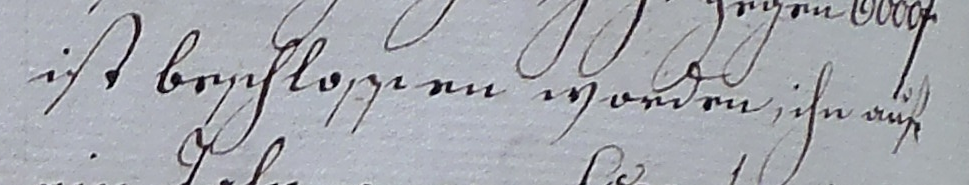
ist beschlossen worden, ihn auf
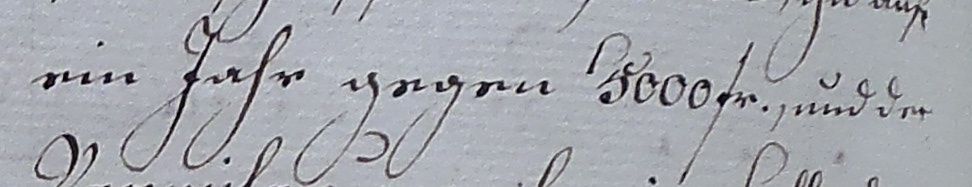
ein Jahr gegen 5000fr., und der
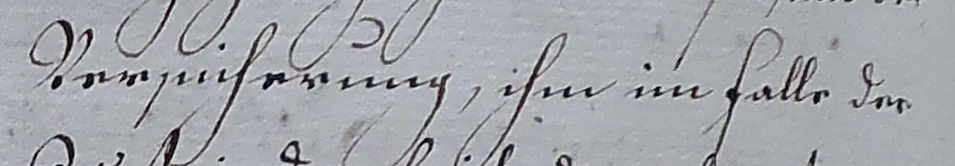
Versicherung, ihm in Falle der
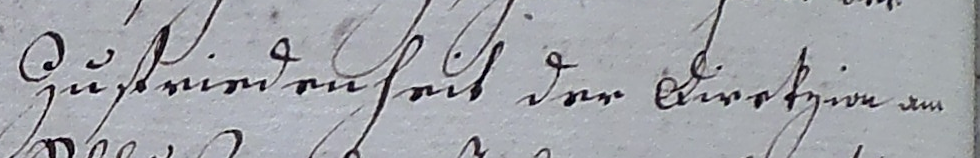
Zufriedenheit der Direkzion am
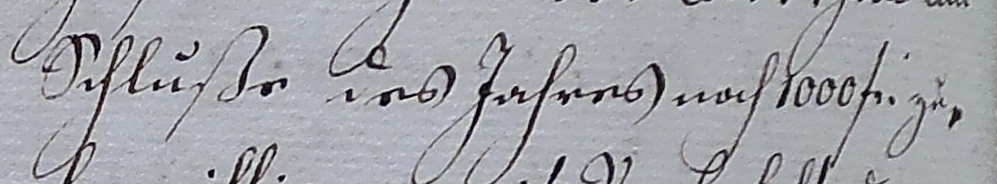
Schluße des Jahres, noch 1000fr. zu¬
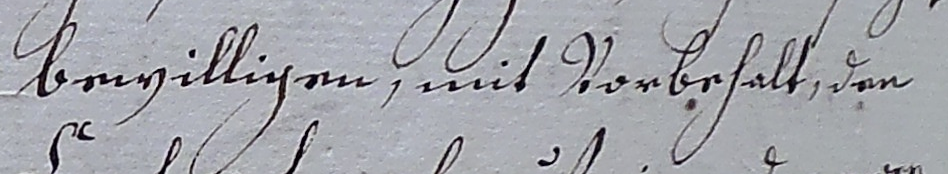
bewilligen, mit Vorbehalt, den
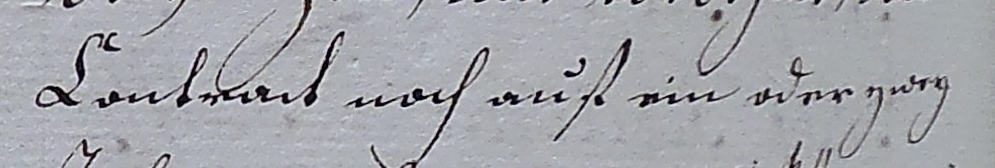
Contract noch auf ein oder zwey
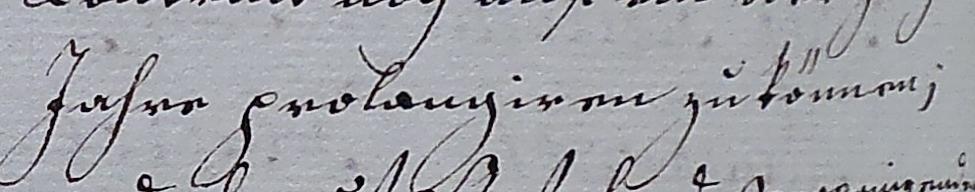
Jahre prolangiren zukönnen;
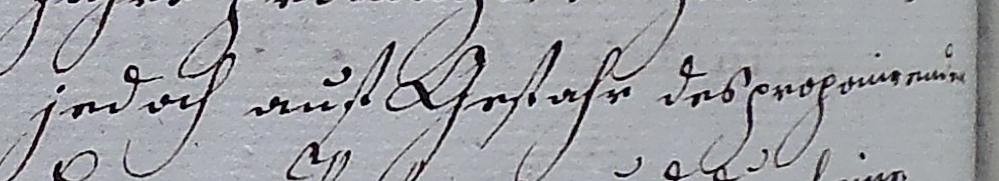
jedoch auf Gefahr des proponirenden
